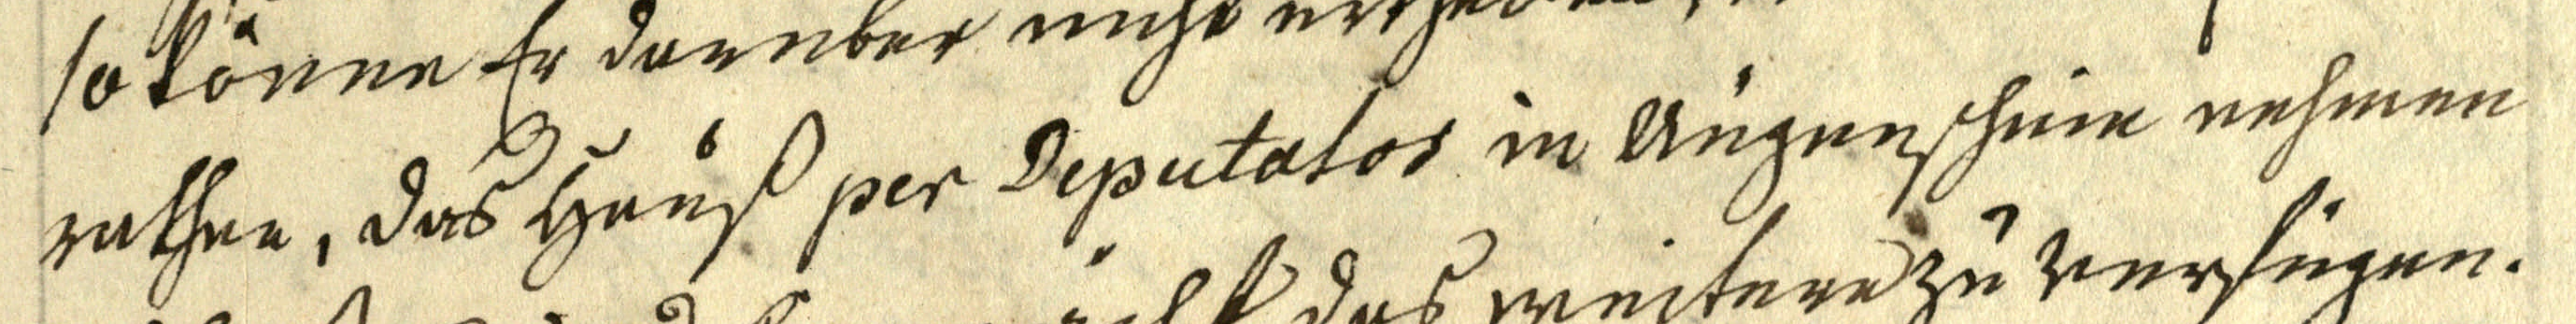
rathen, das Hauß per Deputatos in Augenschein nehmen
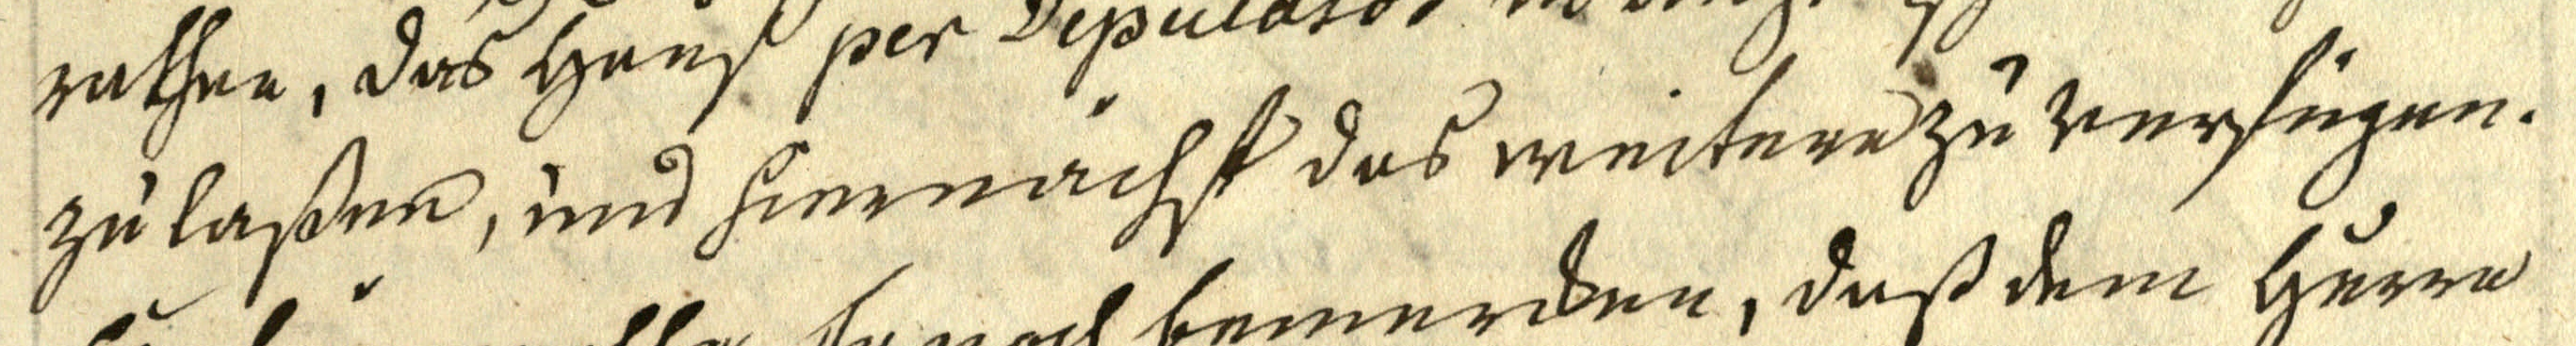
zu laßen, und hiernächst das weitere zu verfügen.
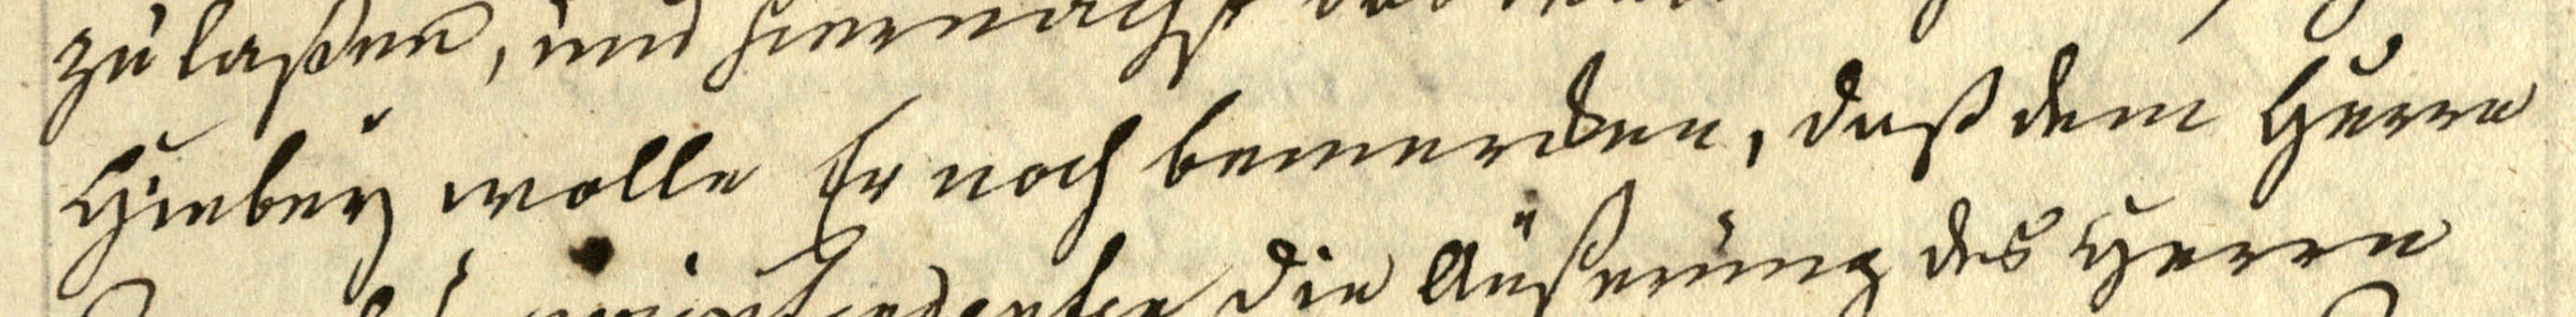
Hiebeÿ wolle Er noch bemercken, daß dem Herrn
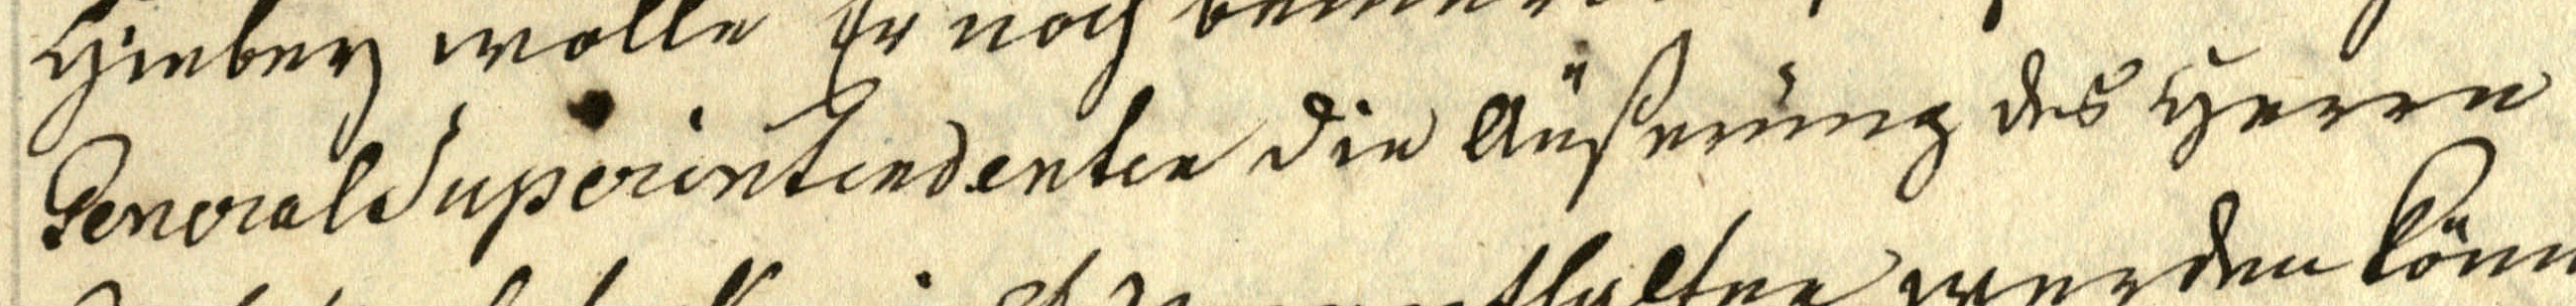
GeneralSuperintendenten die Äußerung des Herrn
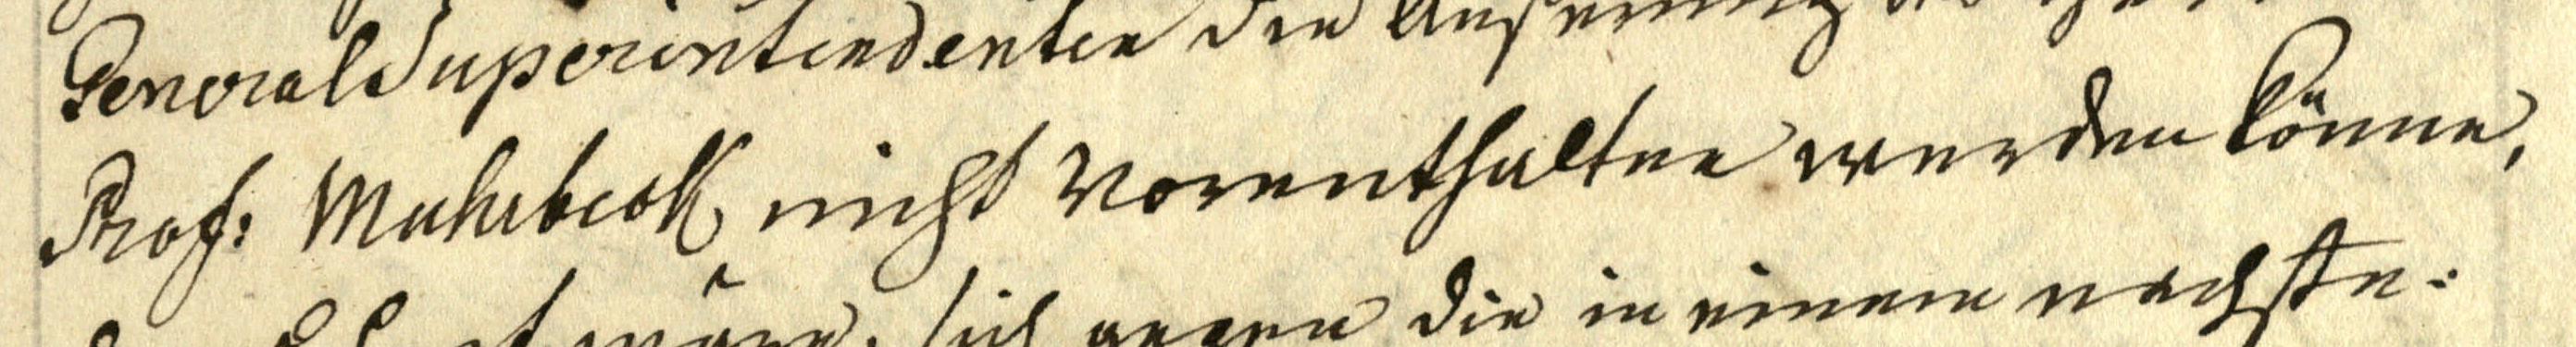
Prof. Muhrbeck. nicht vorenthalten werden könne,
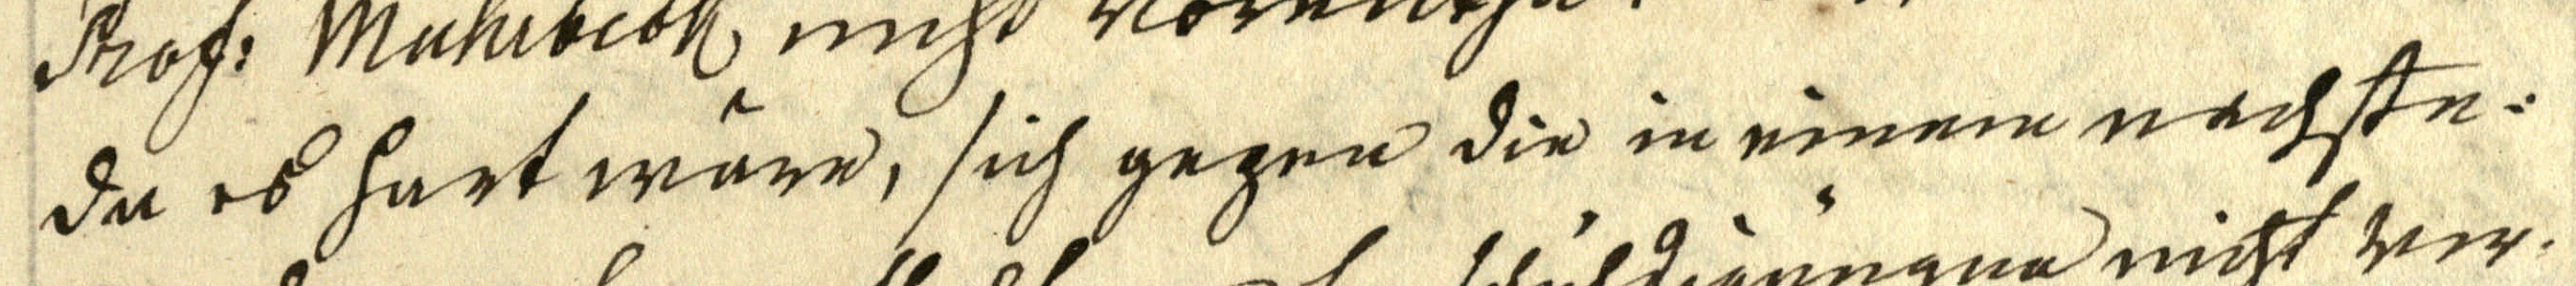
da es hart wäre, sich gegen die in einen nachste¬
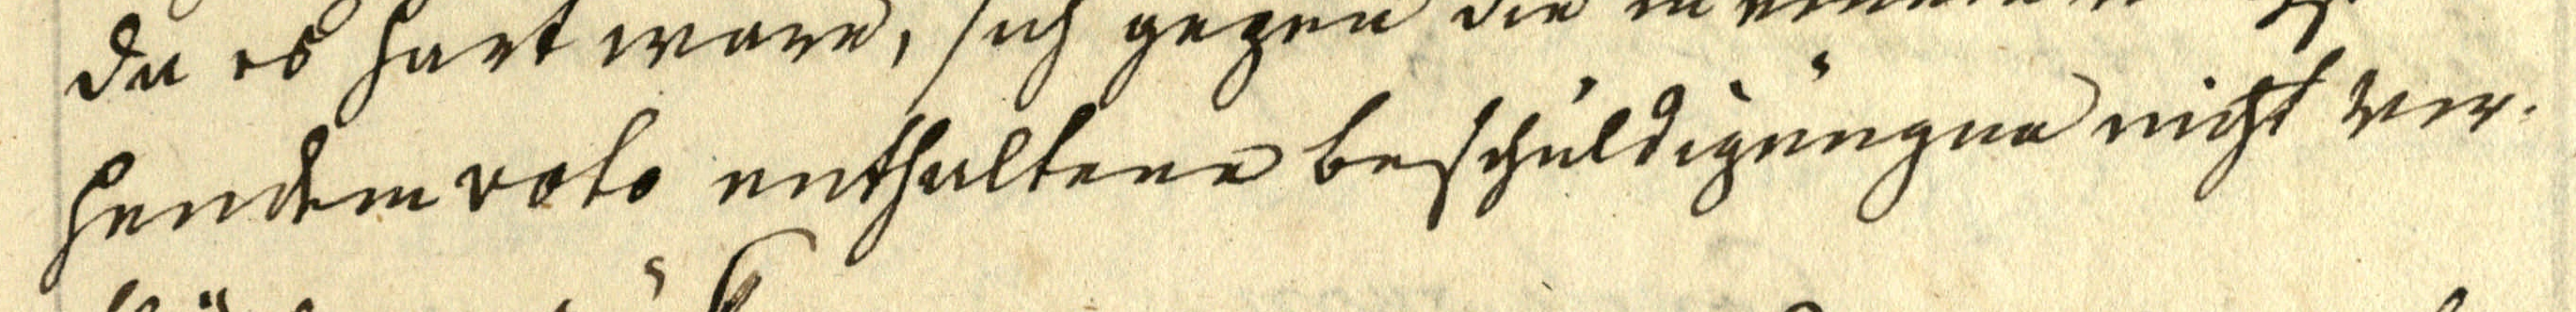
henden voto enthaltene Beschuldigungen nicht ver¬
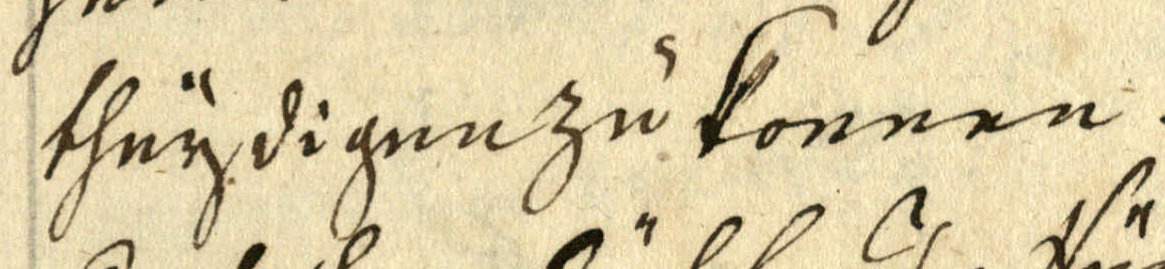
theÿdigen zu können.
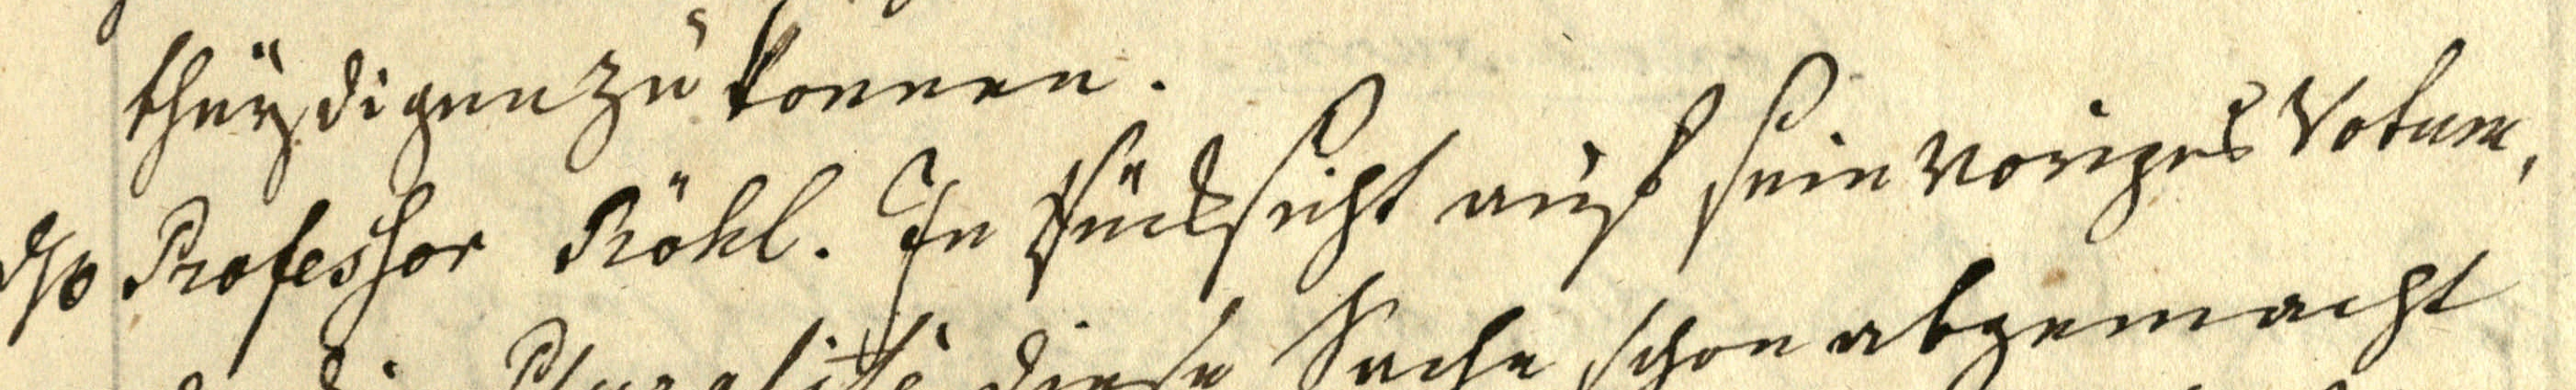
dh Professor Röhl. In Rücksicht auf sein voriges Votum
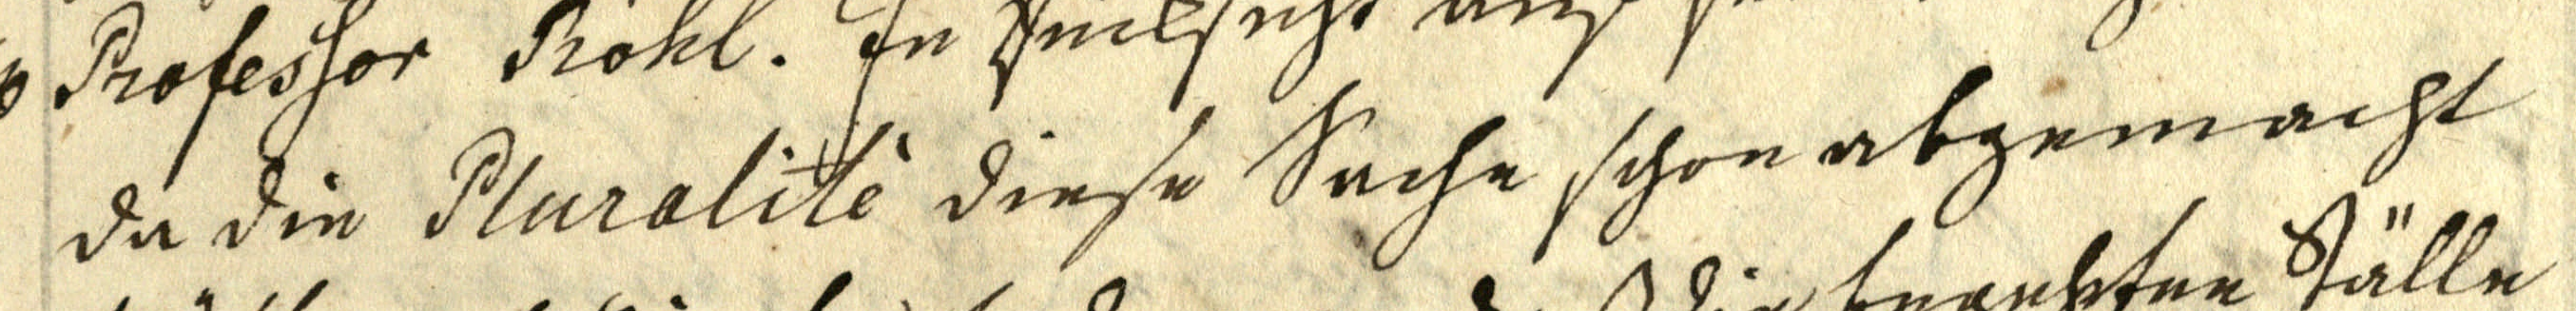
da in Pluralitè diese Sache schon abgemacht
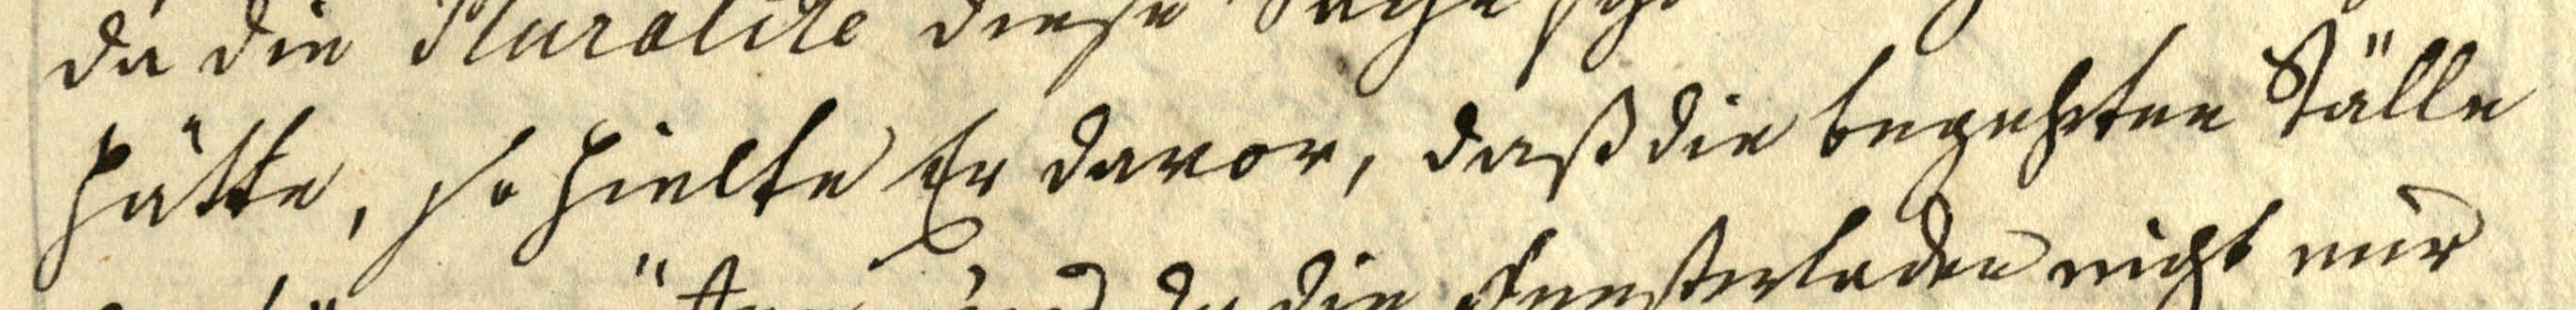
hätte, so hielte Er davor, daß die begehrten Ställe
